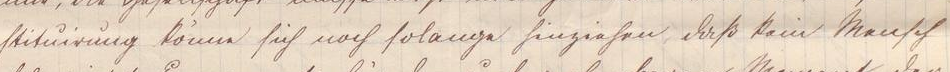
stituirung könne sich noch solange hinziehen, daß kein Mensch
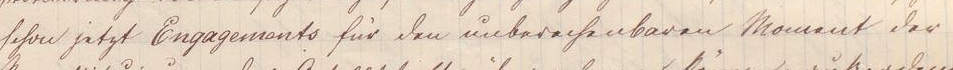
schon jetzt Engagements für den unberechenbaren Moment der
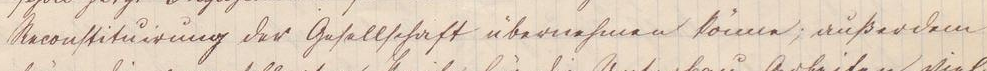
Reconstituirung der Gesellschaft übernehmen könne; außerdem
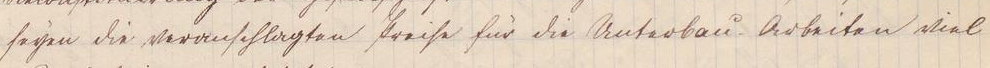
seyen die veranschlagten Preise für die Unterbau-Arbeiten viel
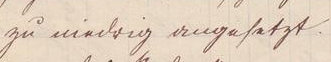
zu niedrig angesetzt.
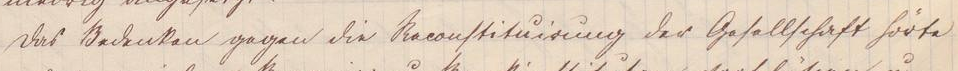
Das Bedenken gegen die Reconstituirung der Gesellschaft hörte
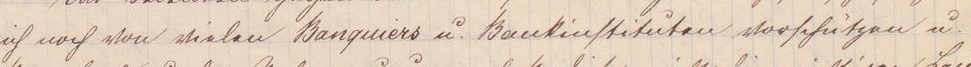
ich noch von vielen Banquiers u. Bankinstituten vorschützen u.
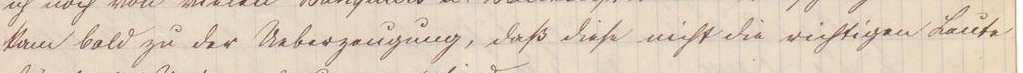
kam bald zu der Ueberzeugung, daß diese nicht die richtigen Leute
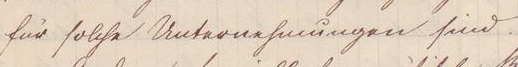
für solche Unternehmungen sind.
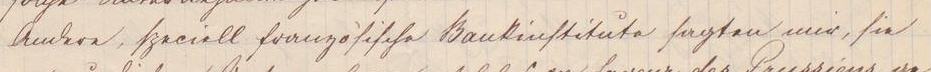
Andere, speciell französische Bankinstitute sagten mir, sie
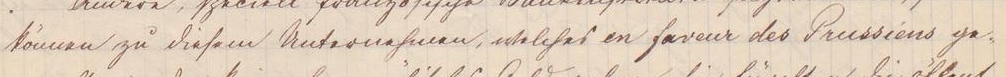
können zu diesem Unternehmen, welches en faveur des Prussiens ge-
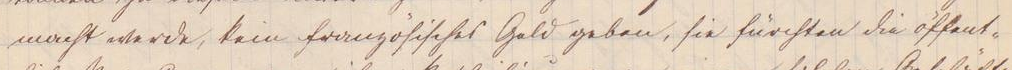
macht werde, kein französisches Geld geben, sie fürchten die öffent-
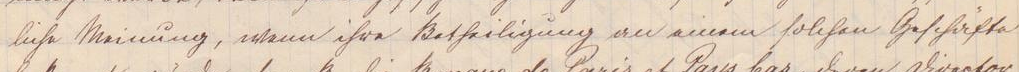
liche Meinung, wenn ihre Betheiligung an einem solchen Geschäfte
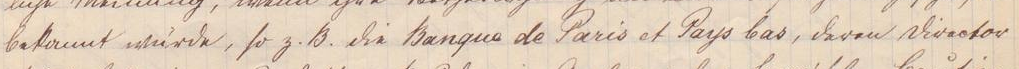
bekannt würde, so z. B. die Banque de Paris et Pays bas, deren Director
